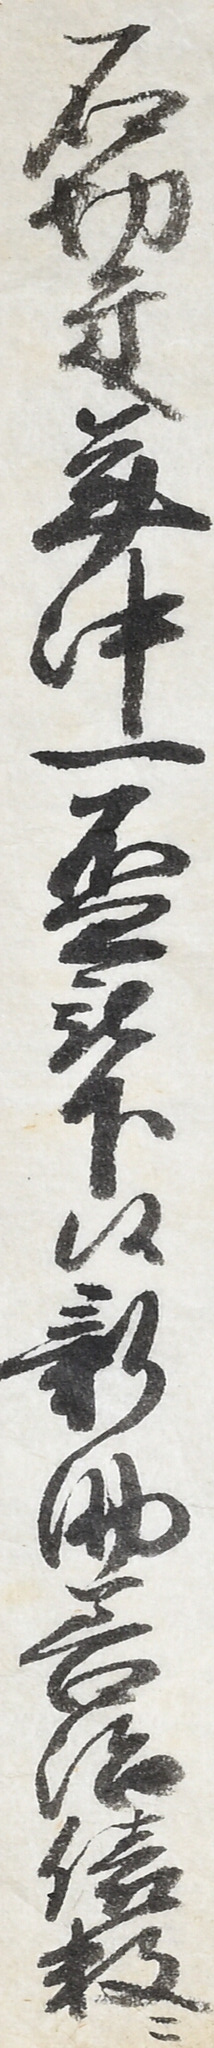石切米年中一盃被下候新助善治俵数ニ
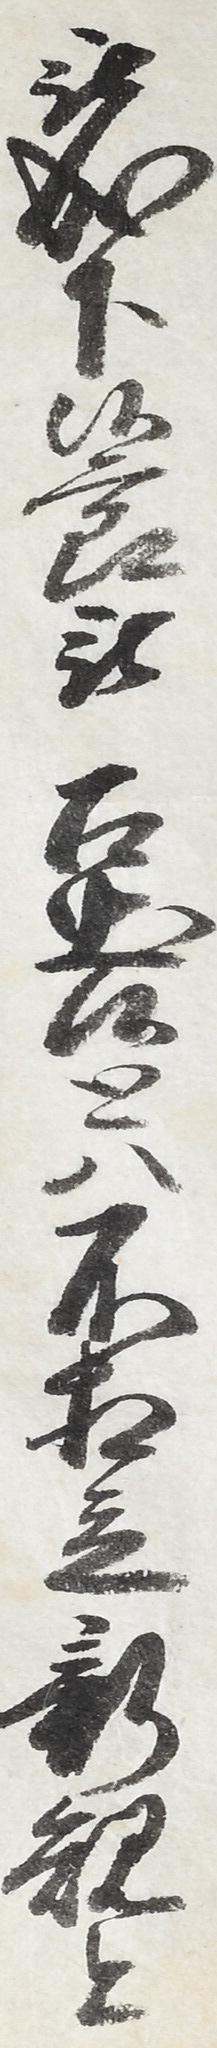被成下候節被召出候とハ不相立新規と
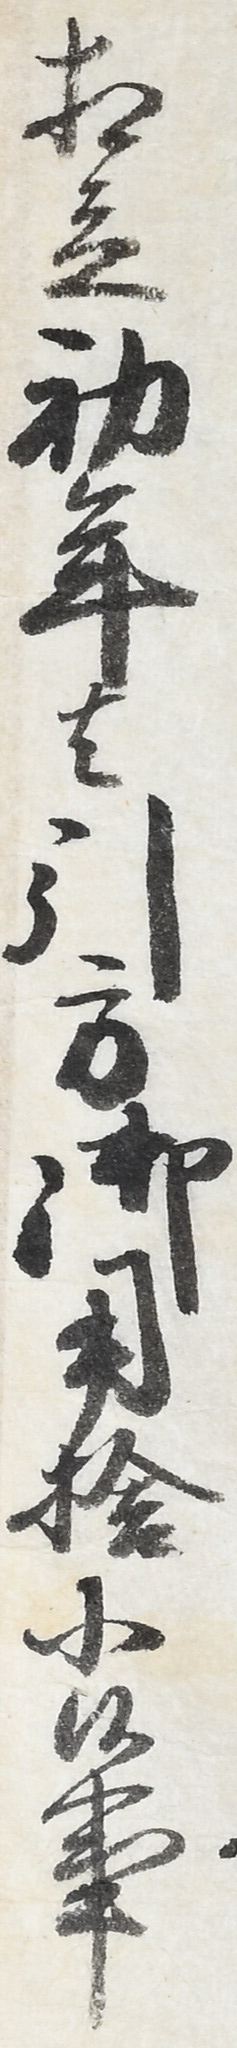相立初年は引方御用捨に候事

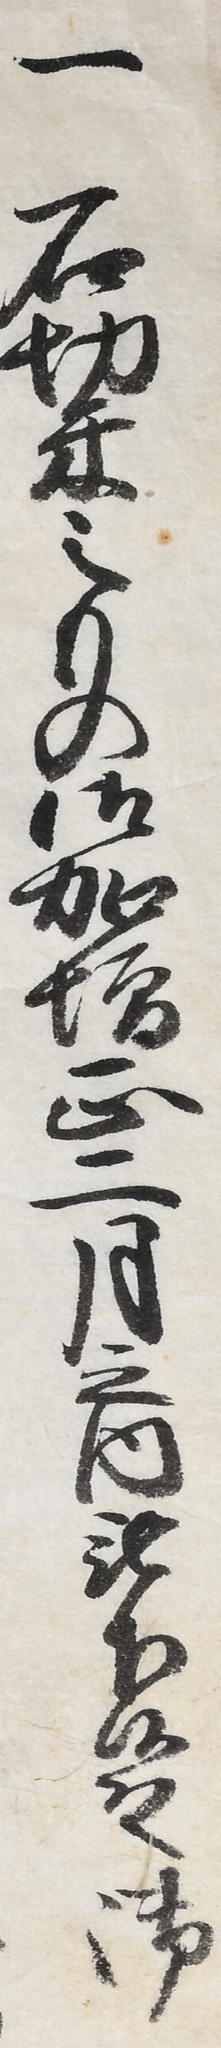一石切米之もの御加増正二月之内被下候ハヽ御
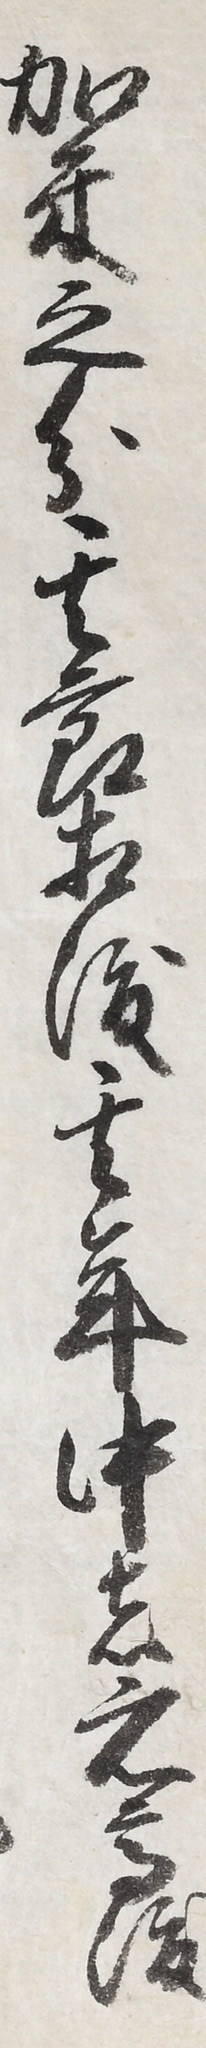加米之分其節相渡其年中は元高渡リ
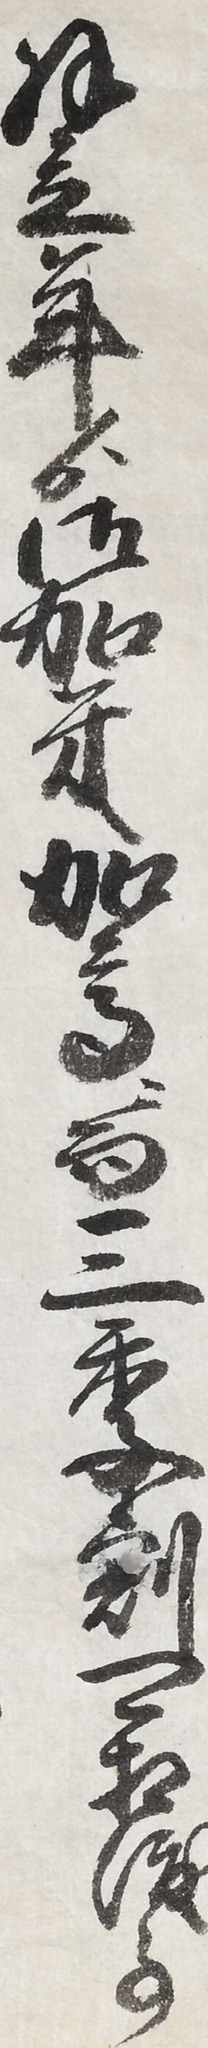翌年ゟ御加米加高ニ而三季割可相渡事
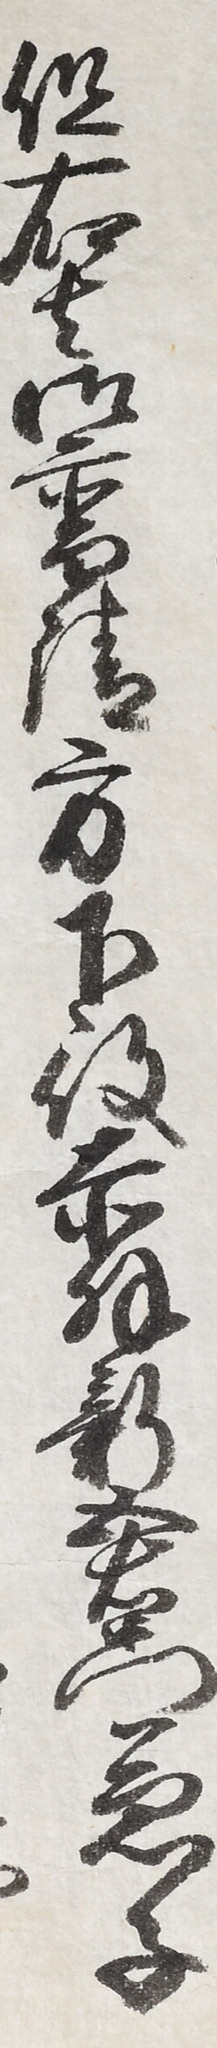但右は御普請方下役赤羽新五右衛門兼子
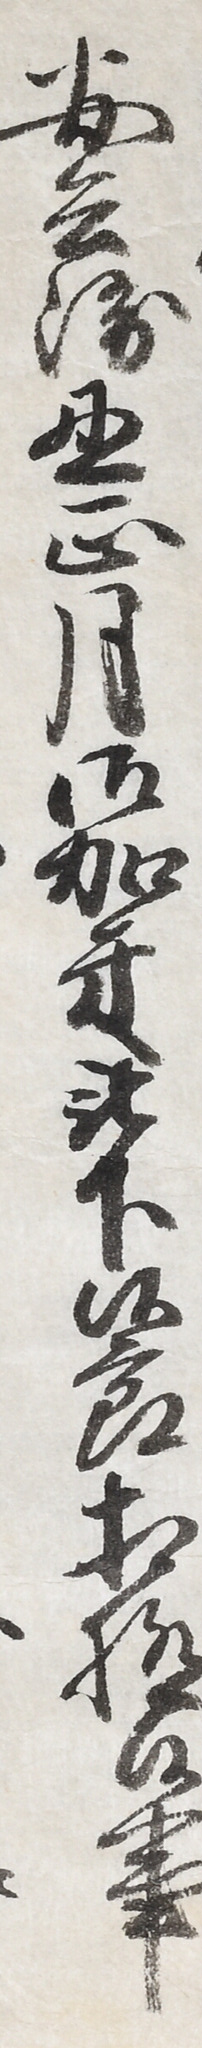安兵衛丑正月御加米被下候節相極候事
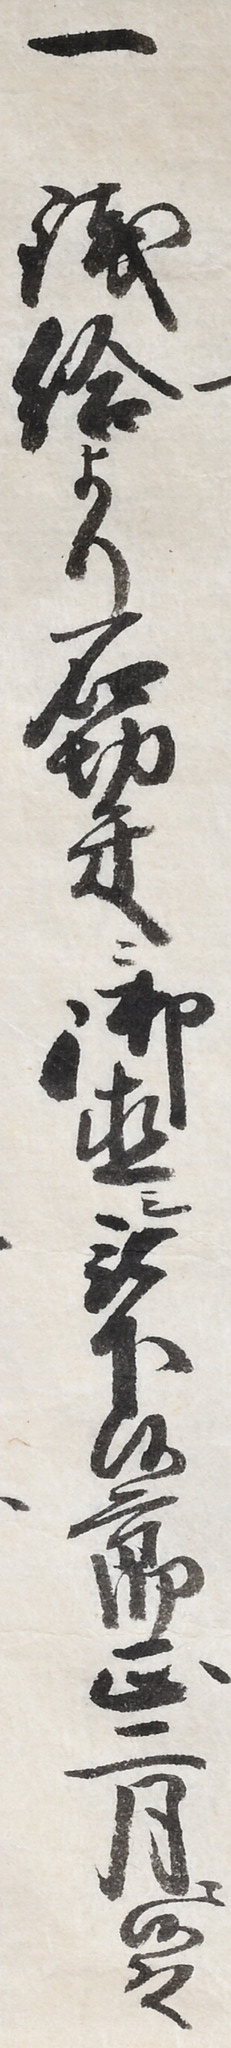一銭給より石切米ニ御直シ被下候節正二月ニ候ハヽ
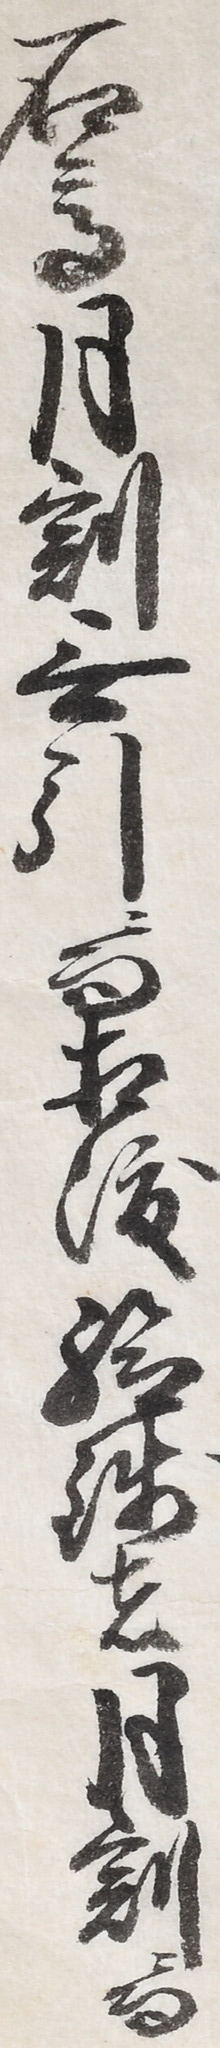石高月割無引ニ而相渡給銭は月割ニ而
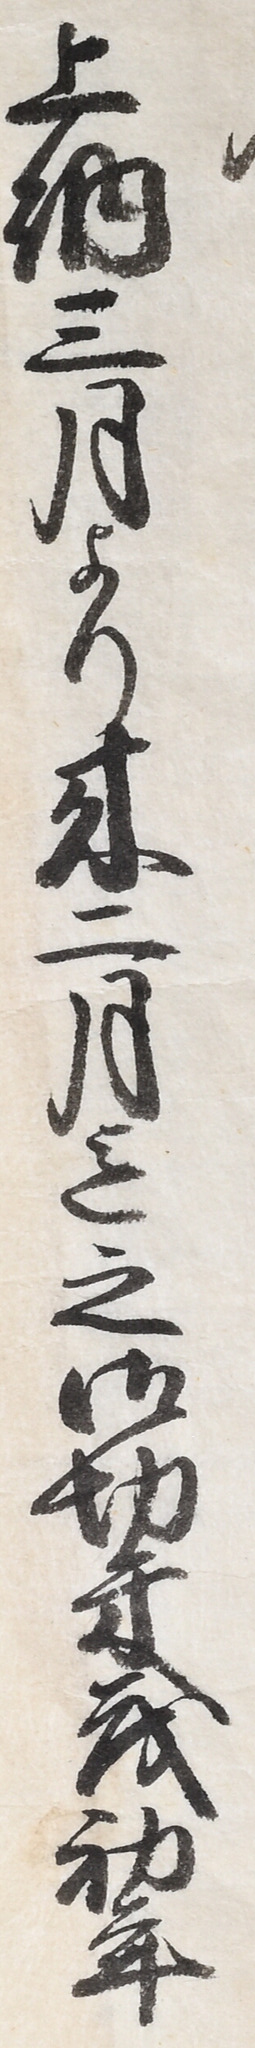上納三月より来二月迄之御切米も初年
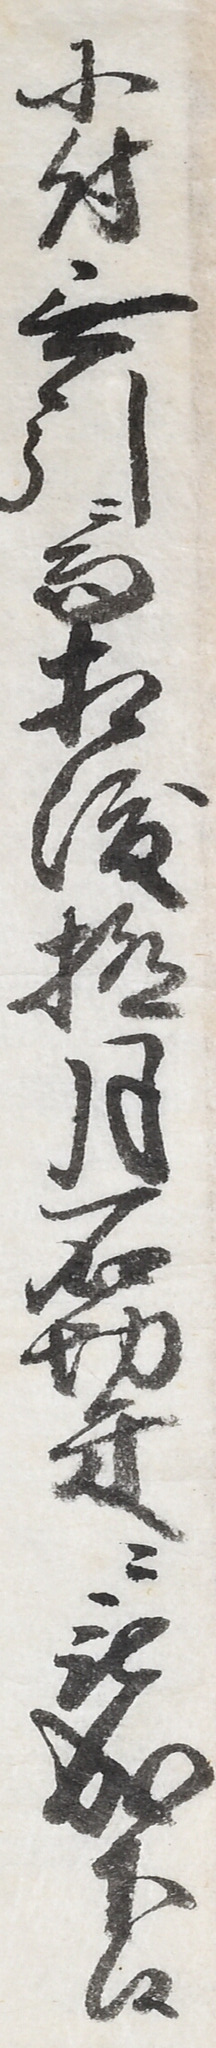に付無引ニ而相渡極月石切米ニ被成下候
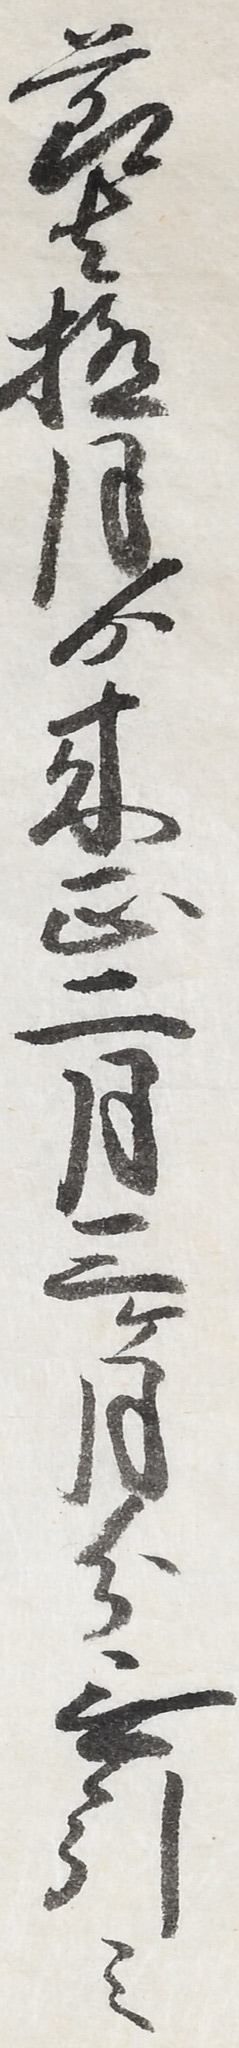節は極月ゟ来正月二月三ヶ月分無引之
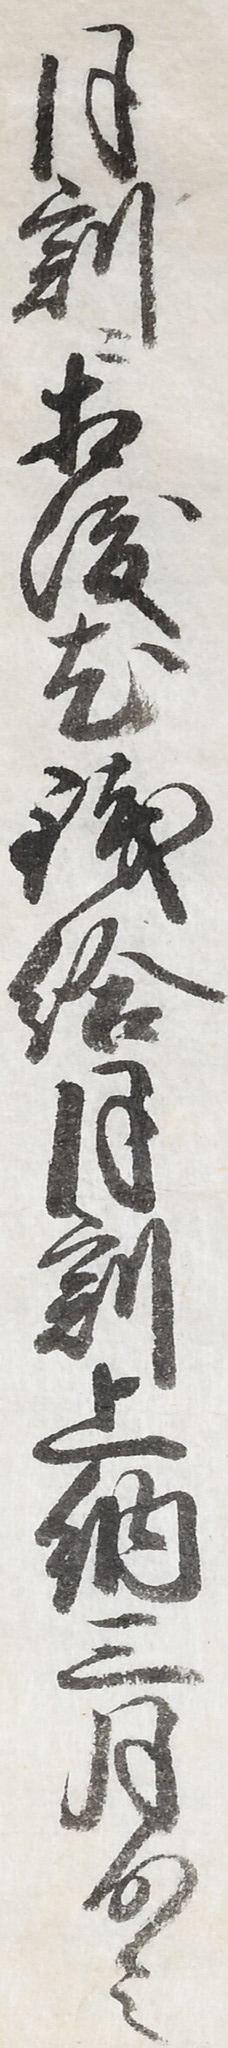月割ニ相渡尤銭給月割上納三月ゟ之
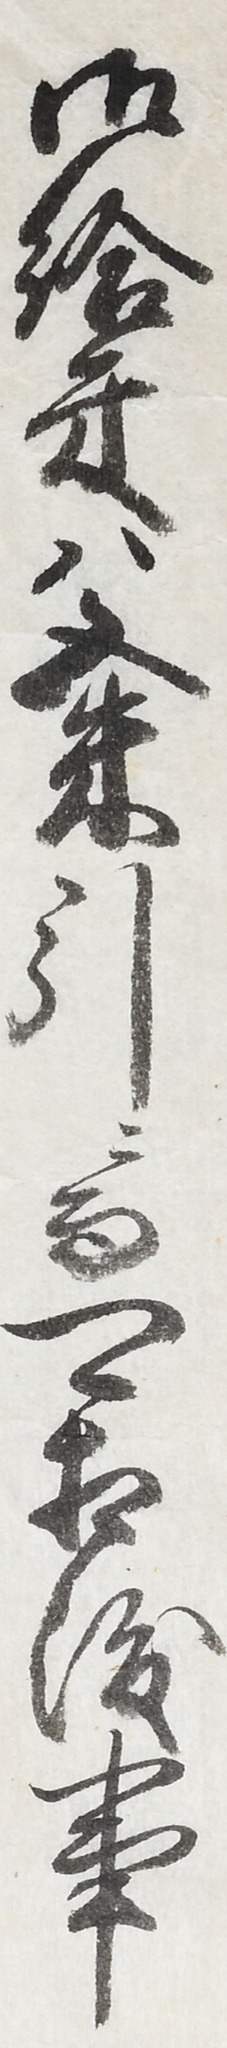御給米ハ五朱引ニ而可相渡事
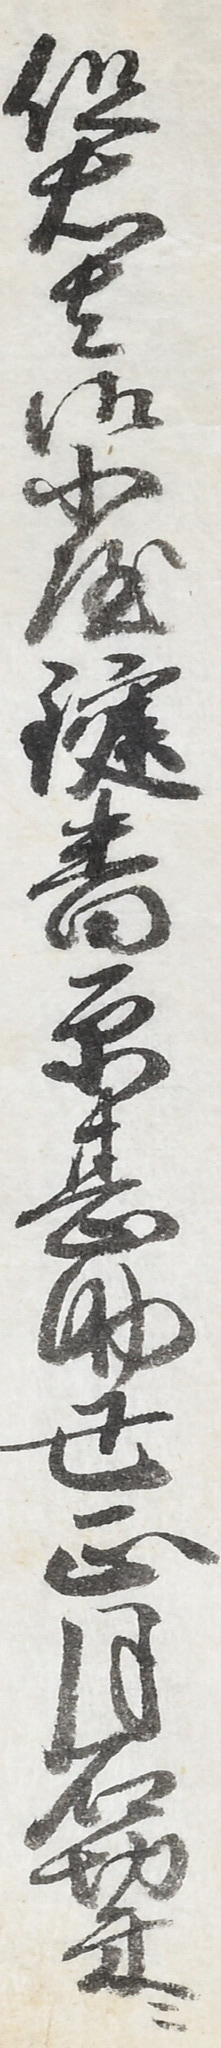但右は御小屋鍵番原甚助丑正月石切米ニ
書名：御給分渡り方定追加
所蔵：伊那市立高遠町図書館・合同会社AMANE
